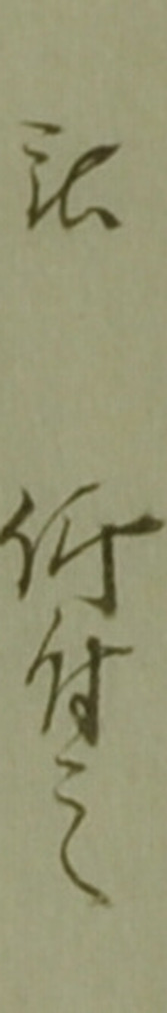被仰付之
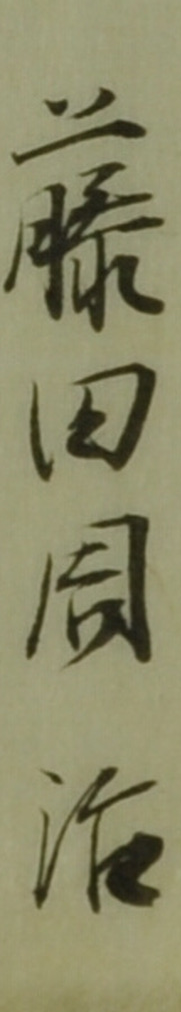藤田周治
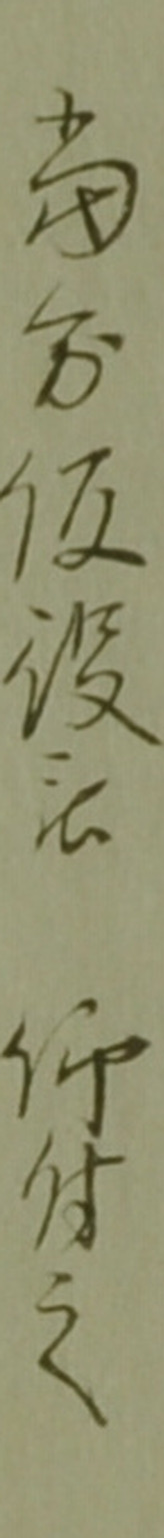当分仮役被仰付之
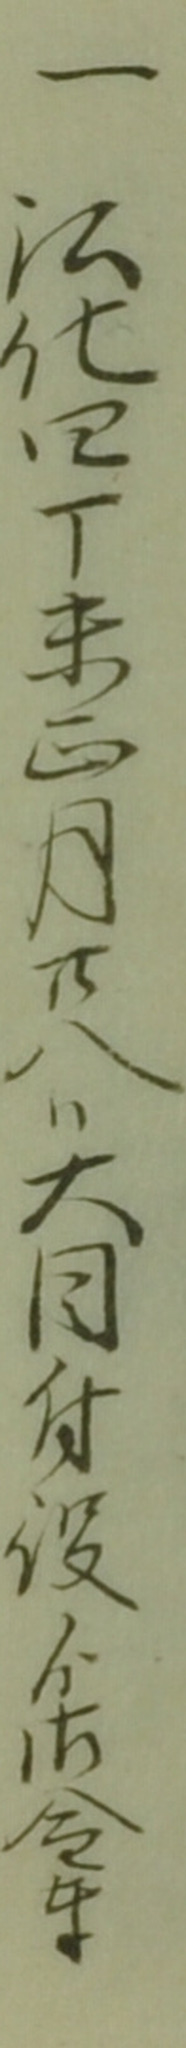一弘化四丁未正月廿八日大目付役ゟ御金奉
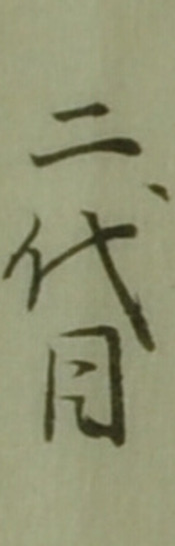二代目
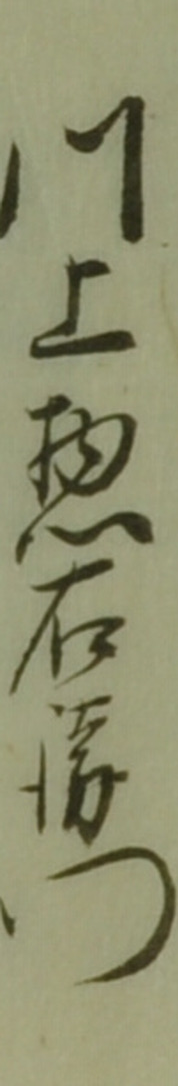川上惣右衛門
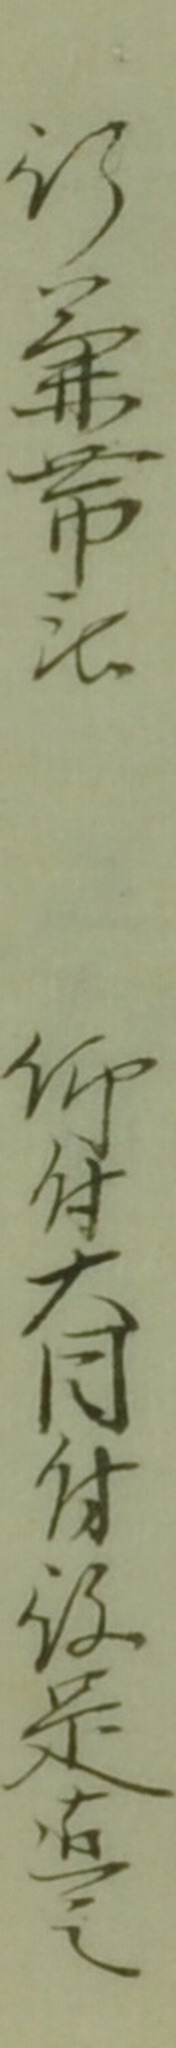行兼帯被仰付大目付役是迄之
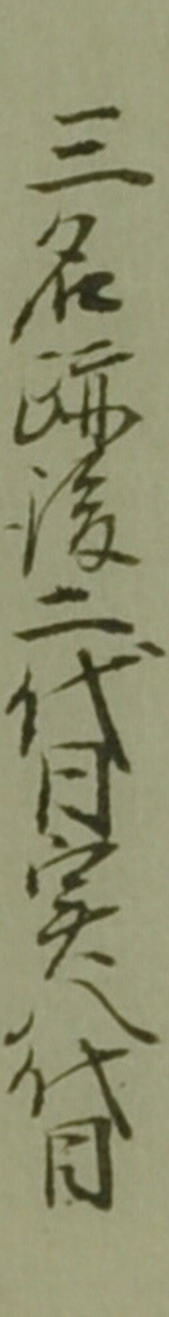三名跡後二代目実八代目
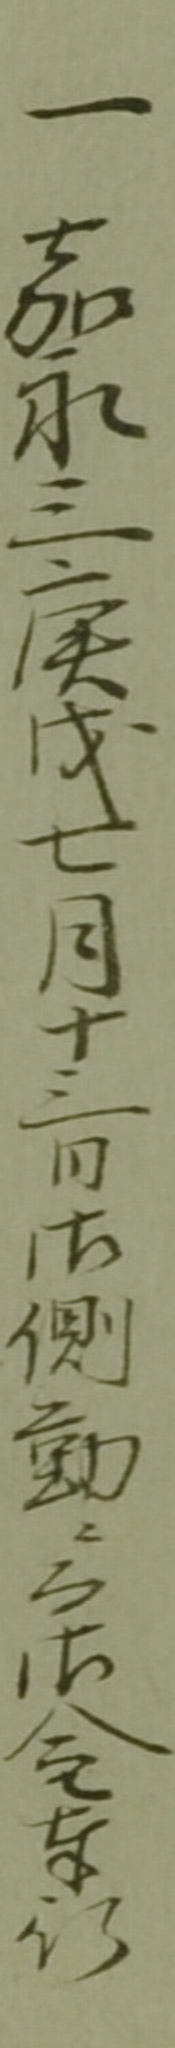一嘉永三庚戌七月十三日御側勤ニ而御金奉行
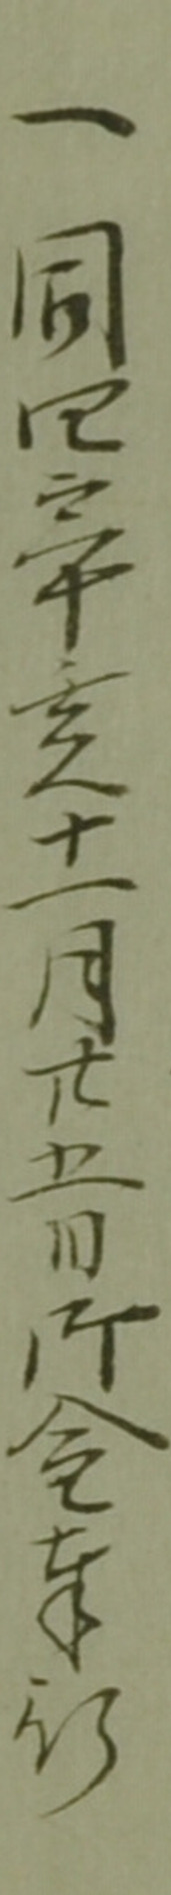一同四辛亥十一月廿五日御金奉行
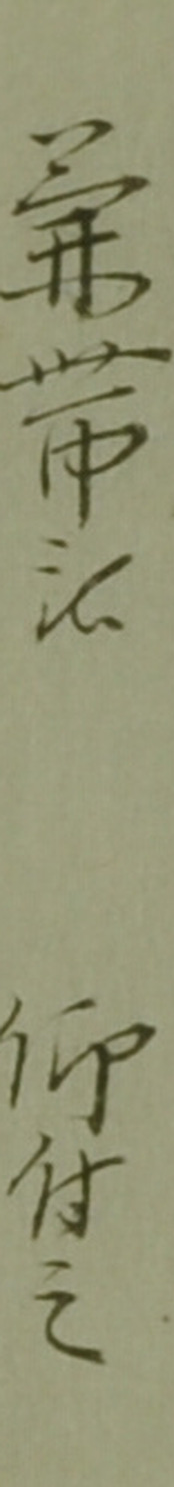兼帯被仰付之
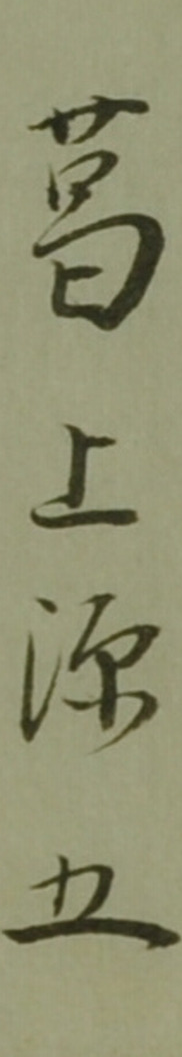葛上源五
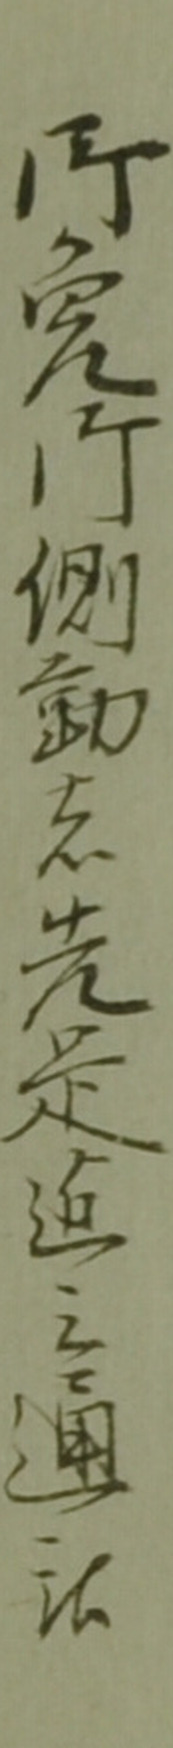御免御側勤者先是迄之通被
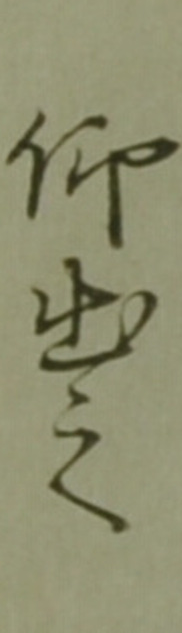仰出之

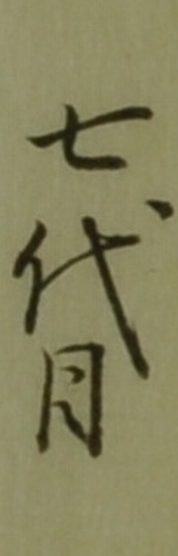七代目
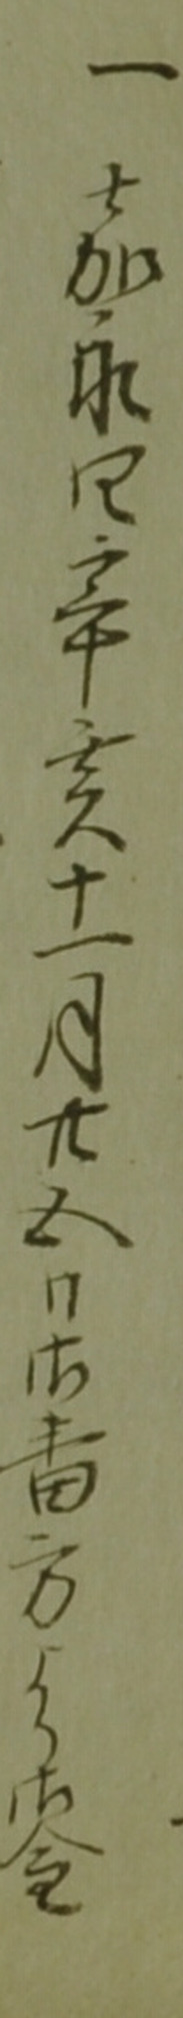一嘉永四辛亥十一月廿五日御番方より御金
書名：諸御役代々録（七）
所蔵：伊那市立高遠町図書館・合同会社AMANE
